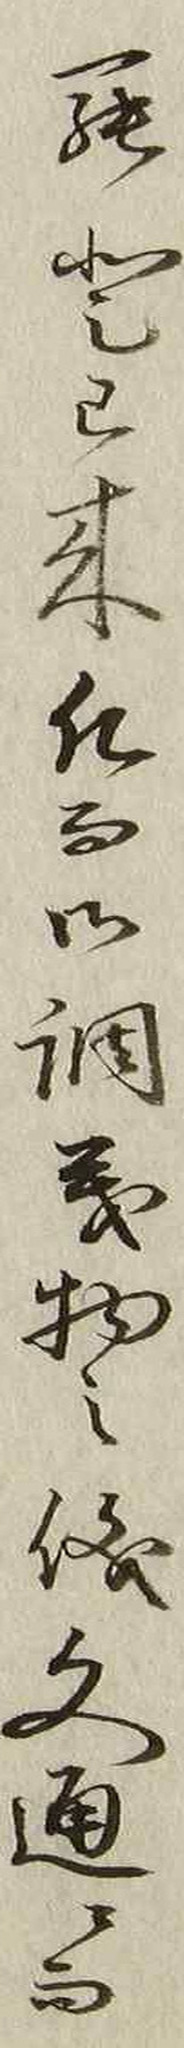罷登已来凡而御調義物之儀文通ニ而
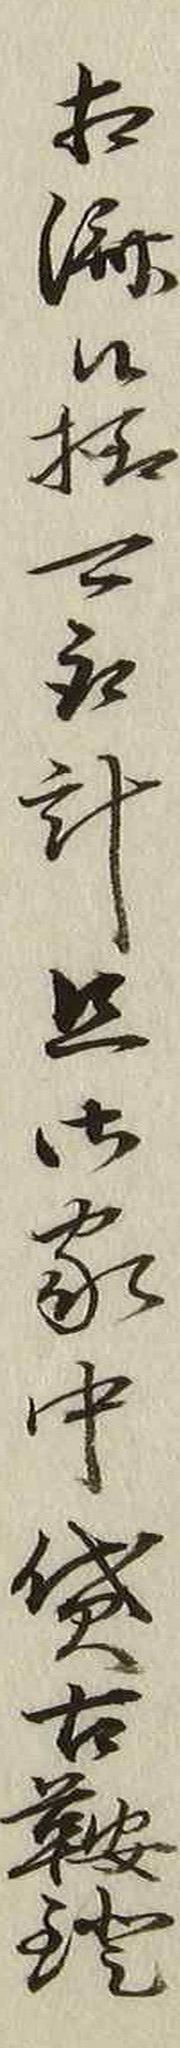相済候様可取計且御家中貸古鞍鐙
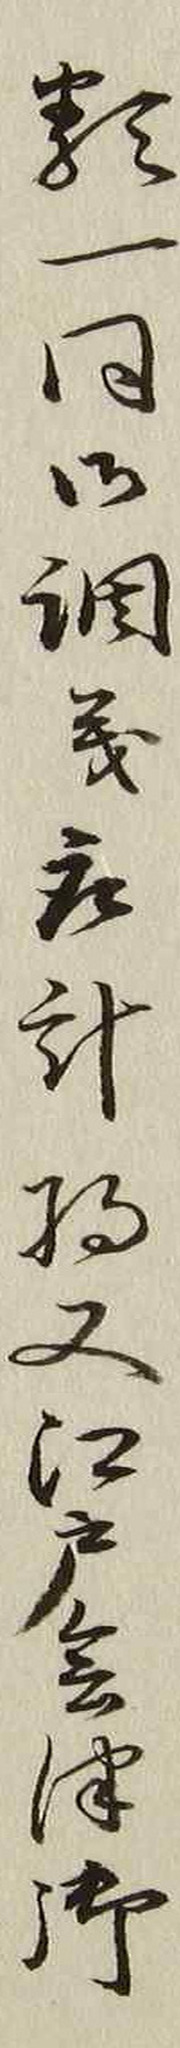類一同御調義取計将又江戸会津御
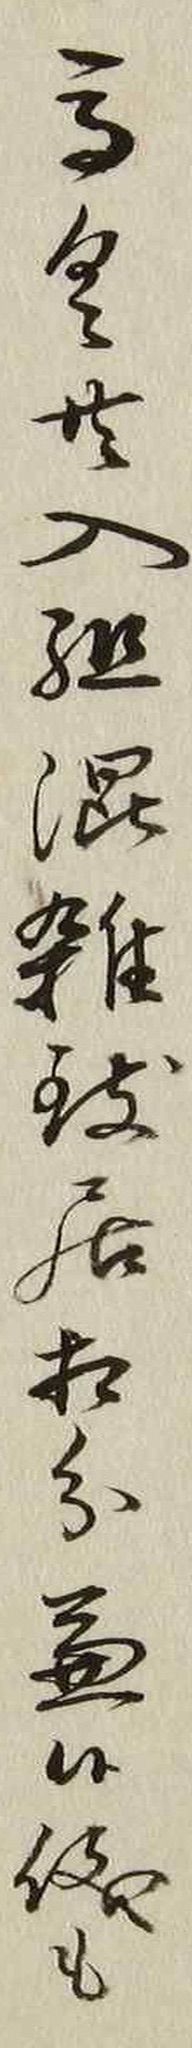馬具共入組混雑致居相分兼候儀も
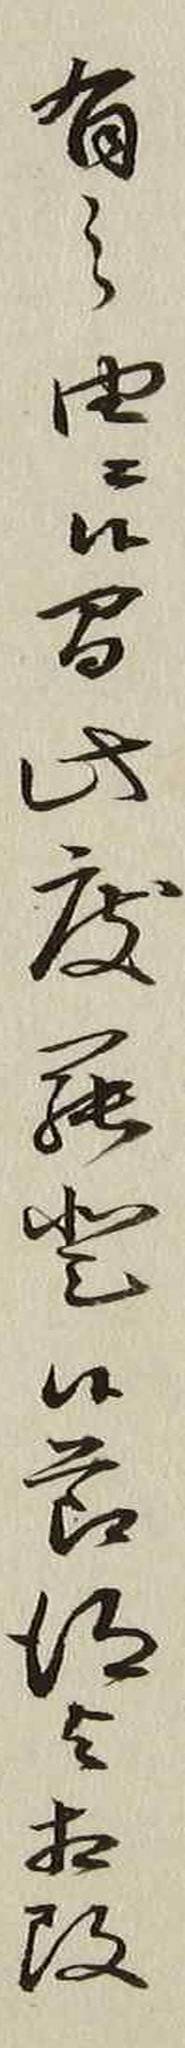有之由ニ候間此度罷登候節得と相改
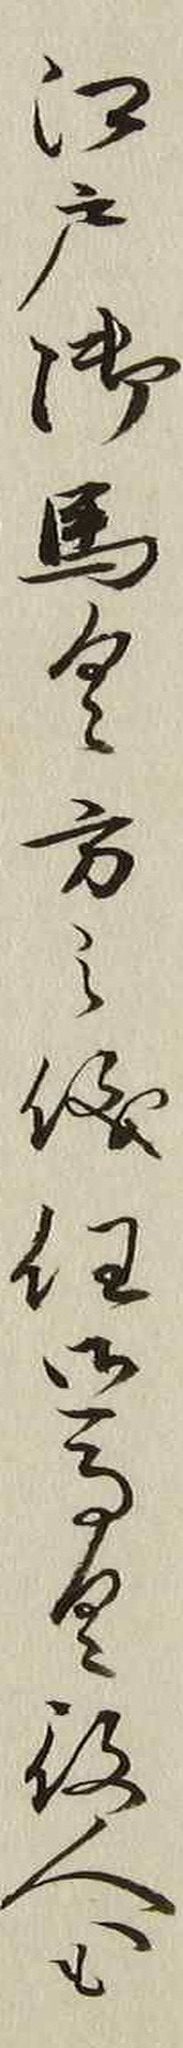江戸御馬具方之儀任御馬具役人へも
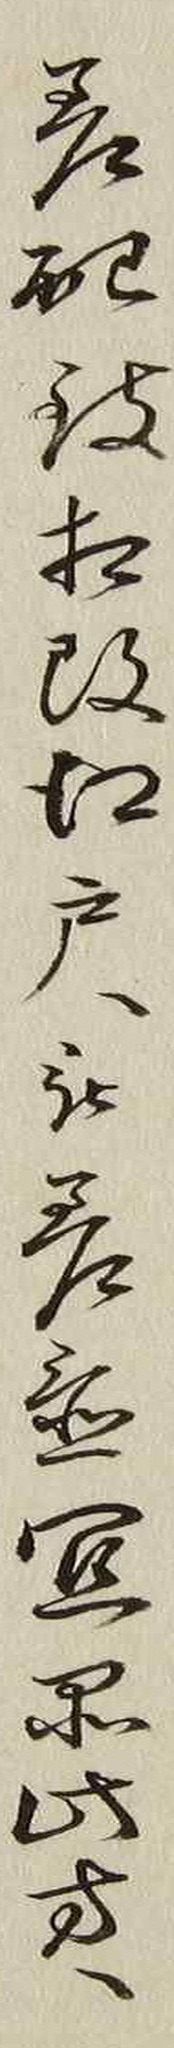差配致相改江戸へ被差置宜品此方へ
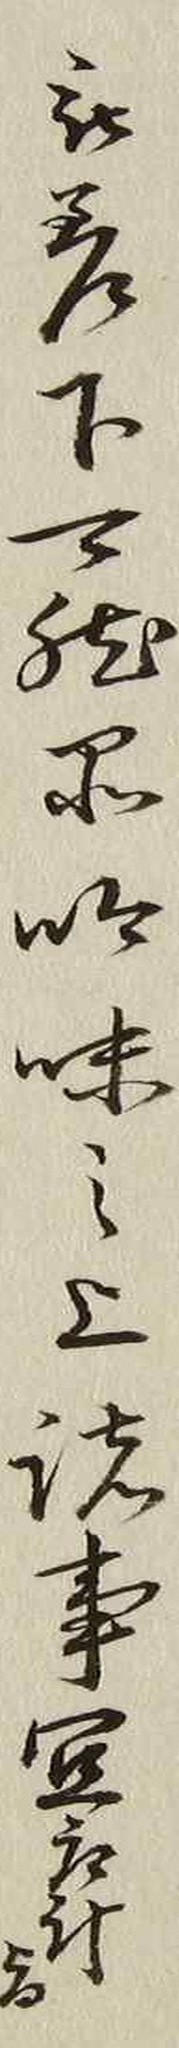差下可然品吟味之上諸事宜取計旨
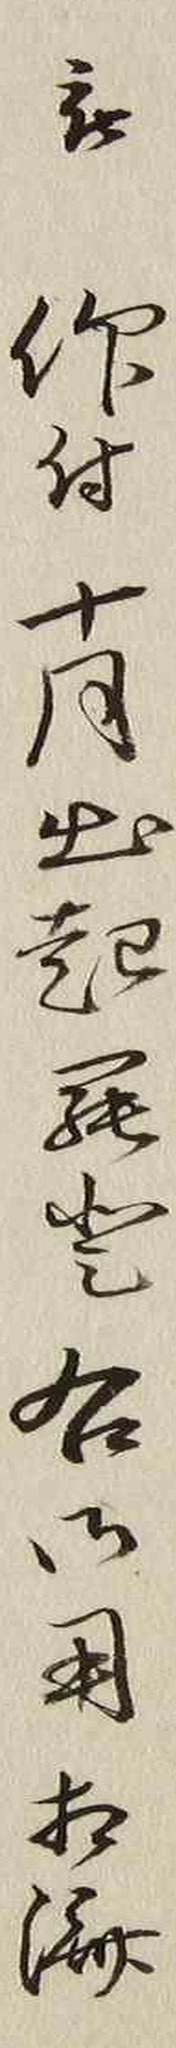被仰付十月出起罷登右御用相済
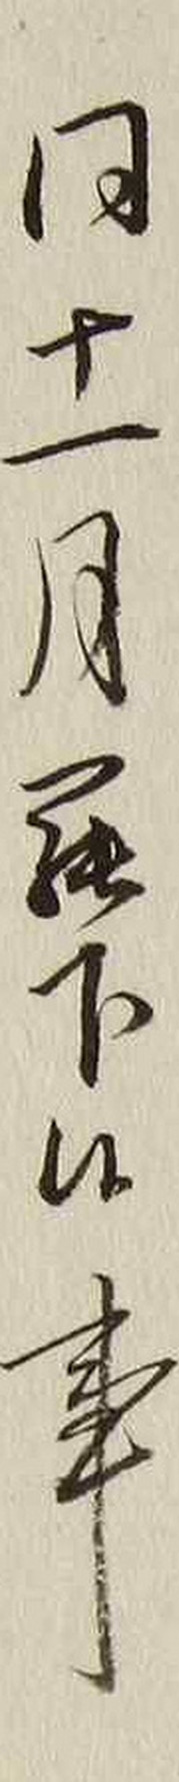同十一月罷下候事
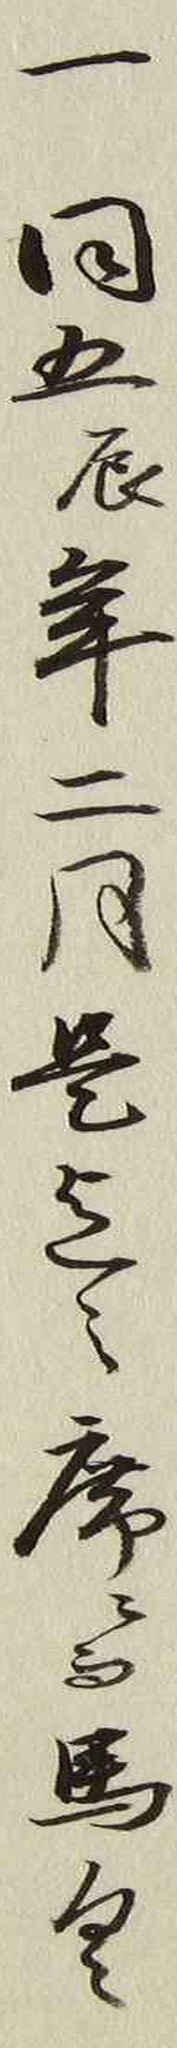一同五辰年二月是迄之席ニ而馬具
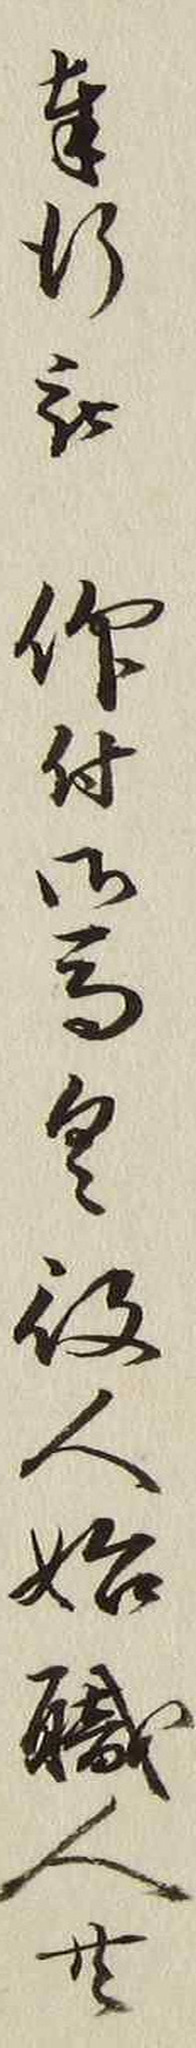奉行被仰付御馬具役人始職人共
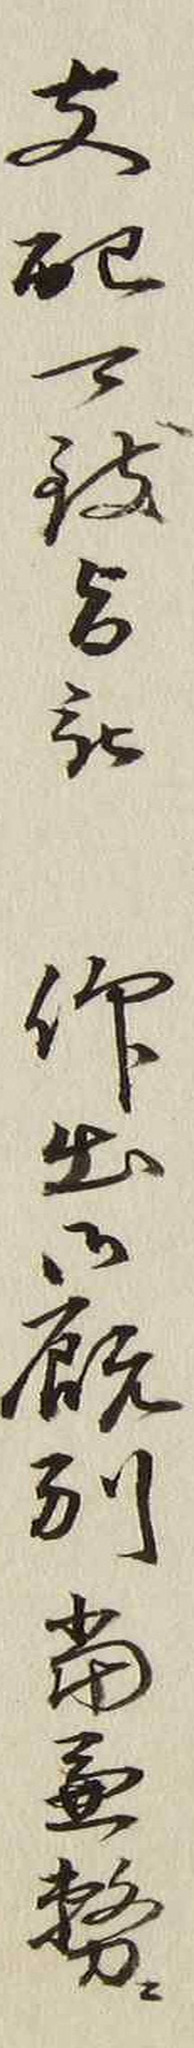支配可致旨被仰出御厩別当兼務ニ
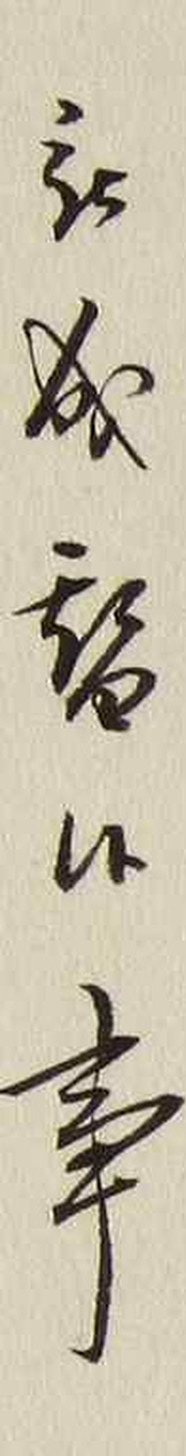被成替候事
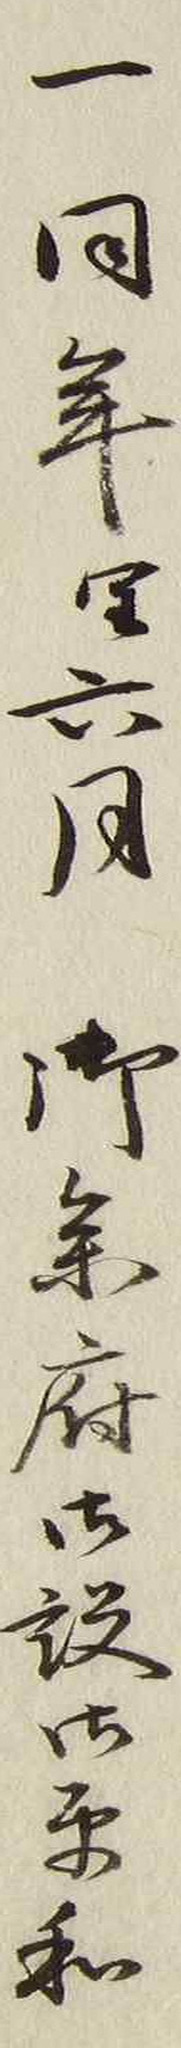一同年閏六月御参府御設御原和

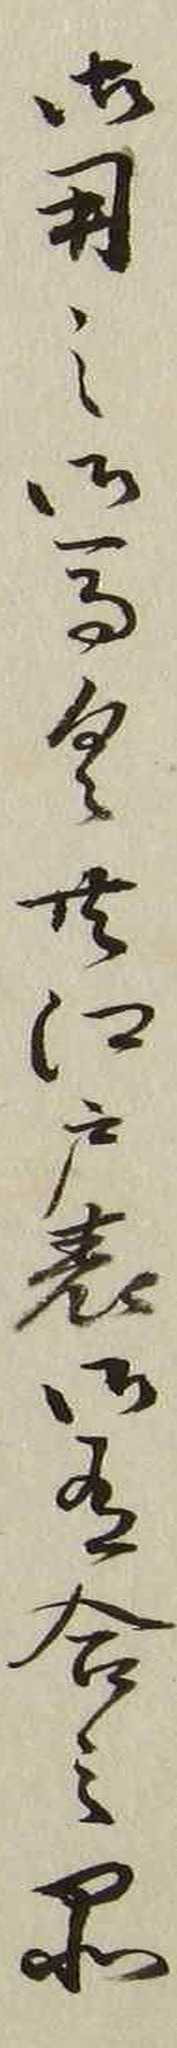御用之御馬具共江戸表御有合之品
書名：諸士系譜　巻之160　な之部2
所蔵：会津若松市立会津図書館
